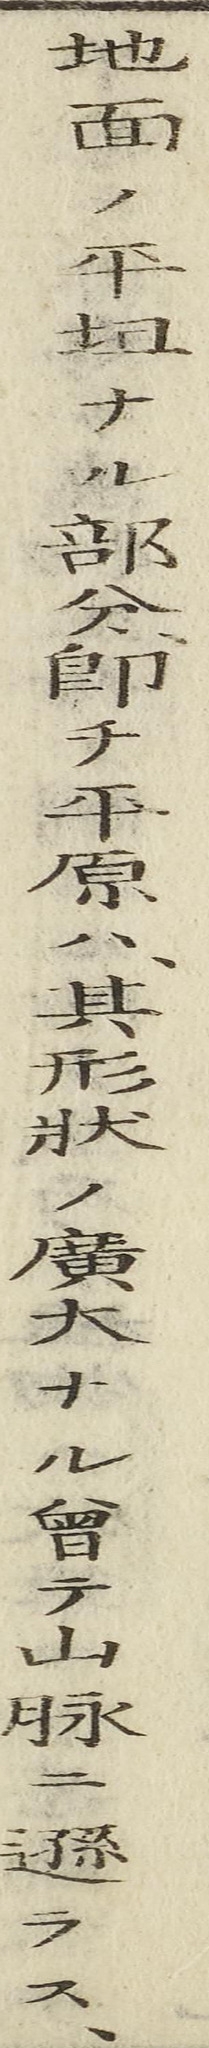地面ノ平坦ナル部分即チ平原ハ、其形状ノ広大ナル嘗テ山脉ニ遜ラス、
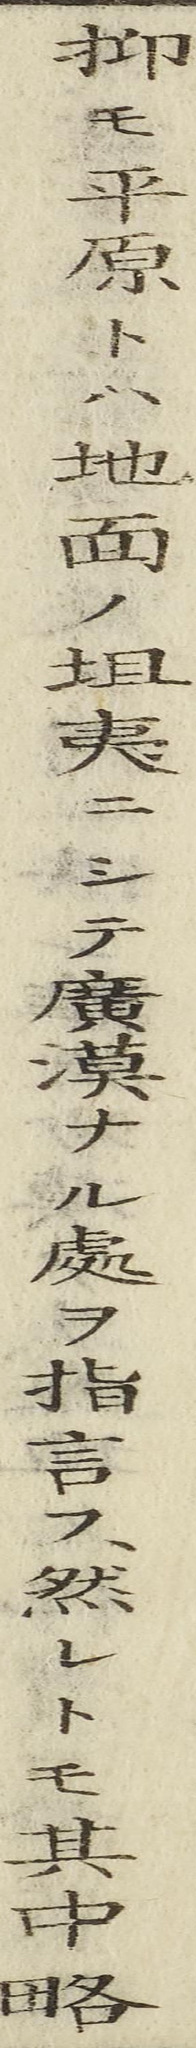抑モ平原トハ地面ノ坦夷ニシテ広漠ナル処ヲ指言フ、然レトモ其中略
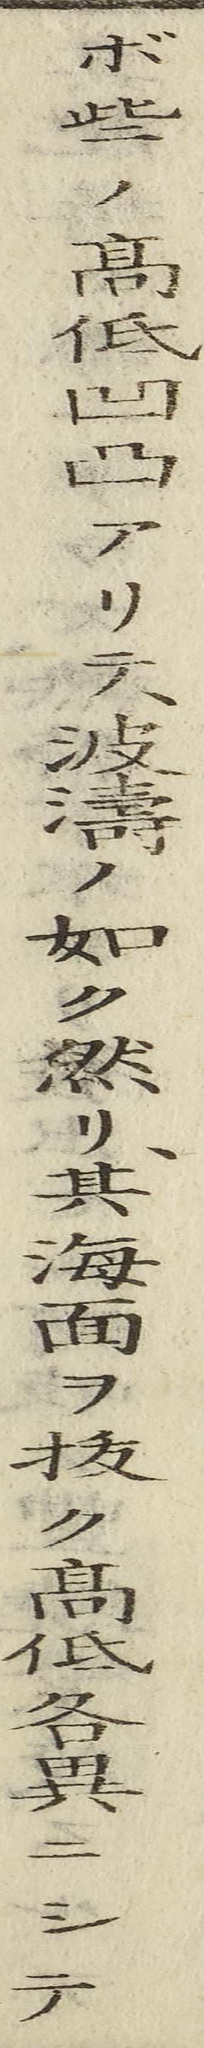ボ些ノ高低凹凸アリテ、波濤ノ如ク然リ、其海面ヲ抜ク高低各異ニシテ

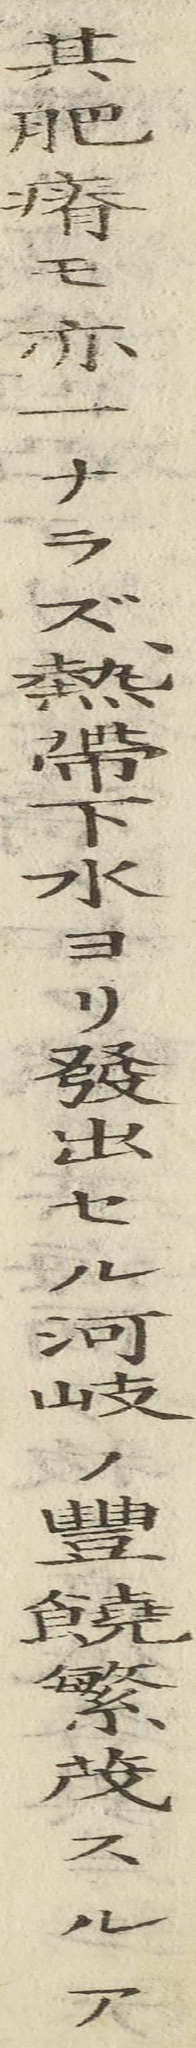其肥瘠モ亦一ナラズ、熱帯下水ヨリ発出セル河岐ノ豊饒繁茂スルア
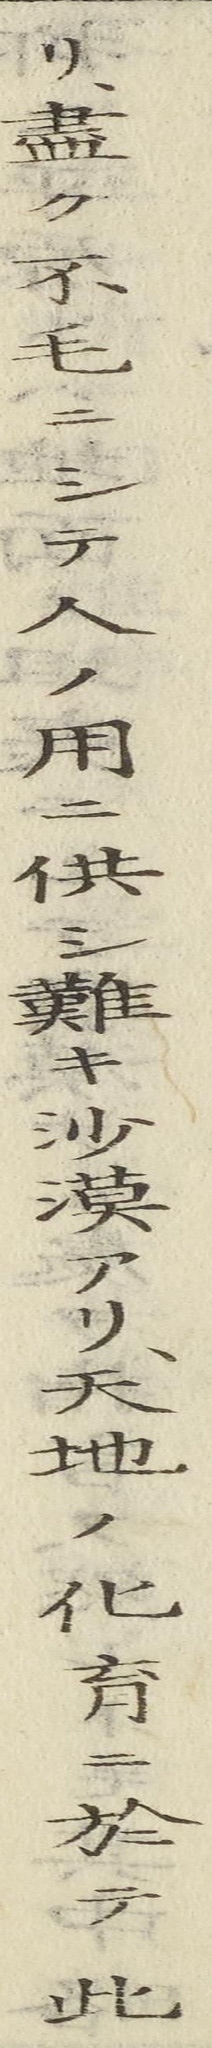リ、尽ク不毛ニシテ人ノ用ニ供シ難キ沙漠アリ、天地ノ化育ニ於テ此
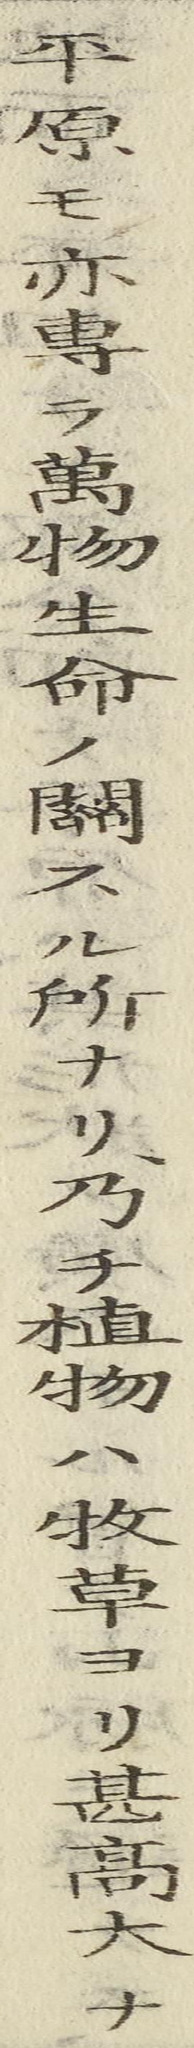平原モ亦専ラ万物生命ノ関スル所ナリ、乃チ植物ハ牧草ヨリ甚高大ナ
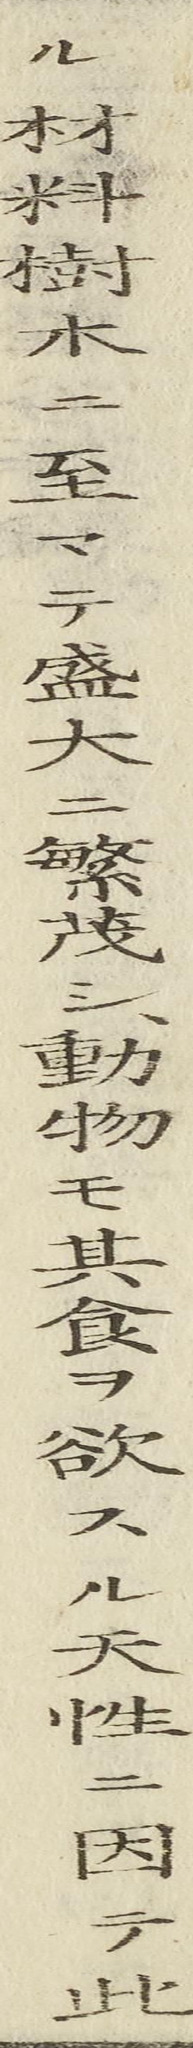ル材料樹木ニ至マテ盛大ニ繁茂シ、動物モ其食ヲ欲スル天性ニ因テ此
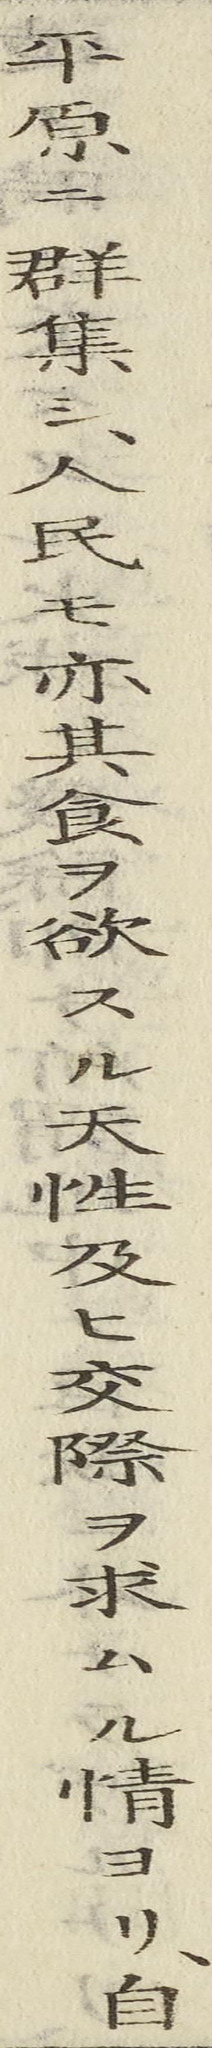平原ニ群集シ、人民モ亦其食ヲ欲スル天性及ヒ交際ヲ求ムル情ヨリ、自
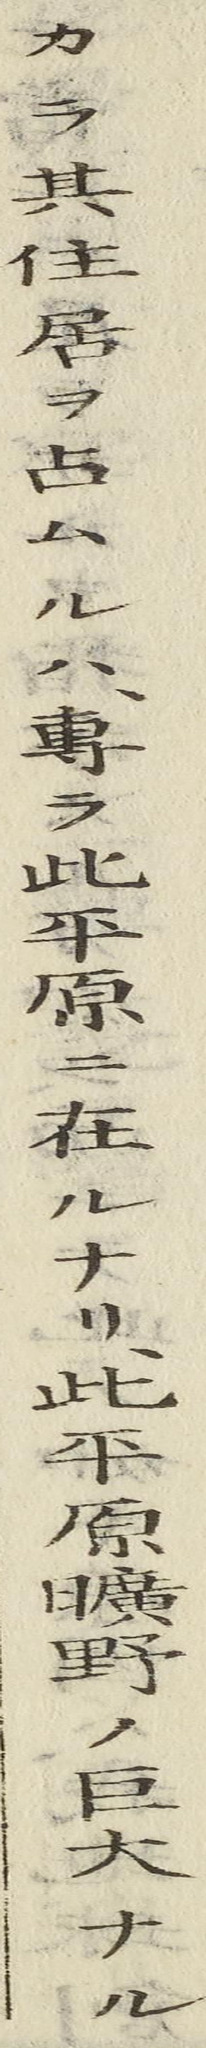カラ其住居ヲ占ムルハ、専ラ此平原ニ在ルナリ、此平原曠野ノ巨大ナル
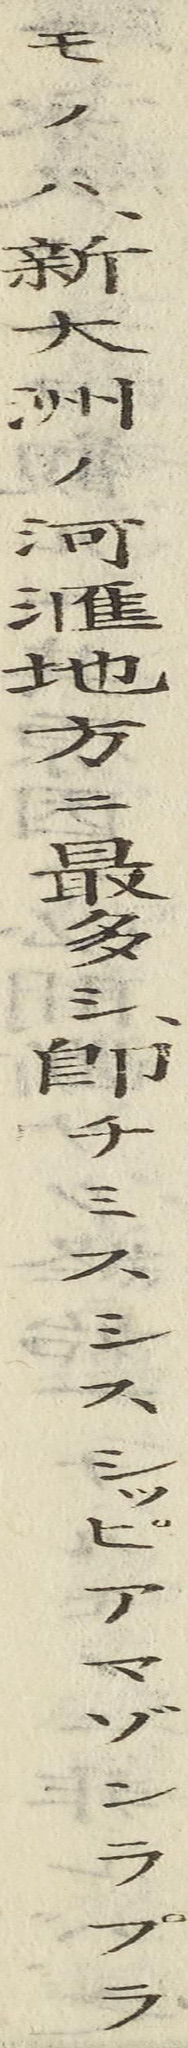モノハ、新大洲ノ河匯地方ニ最多シ、即チミスシスシッピアマゾンラプラ
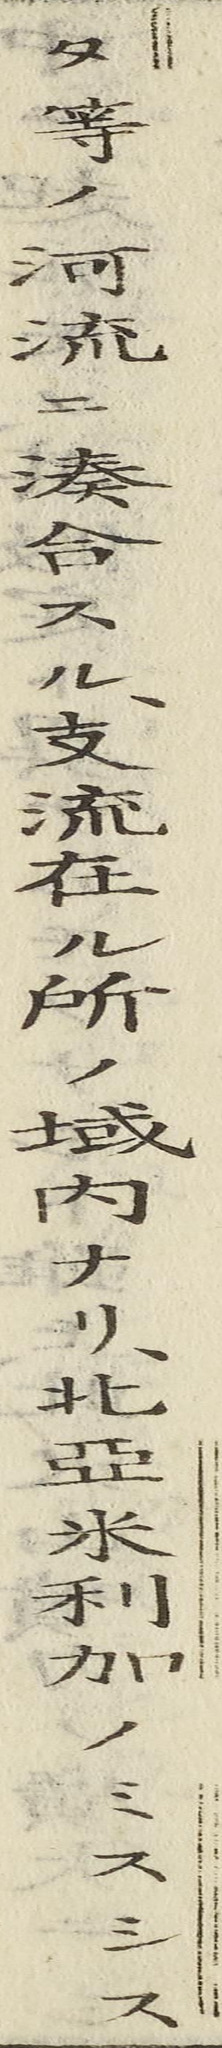タ等ノ河流ニ湊合スル、支流在ル所ノ域内ナリ、北亜米利加ノミスシス
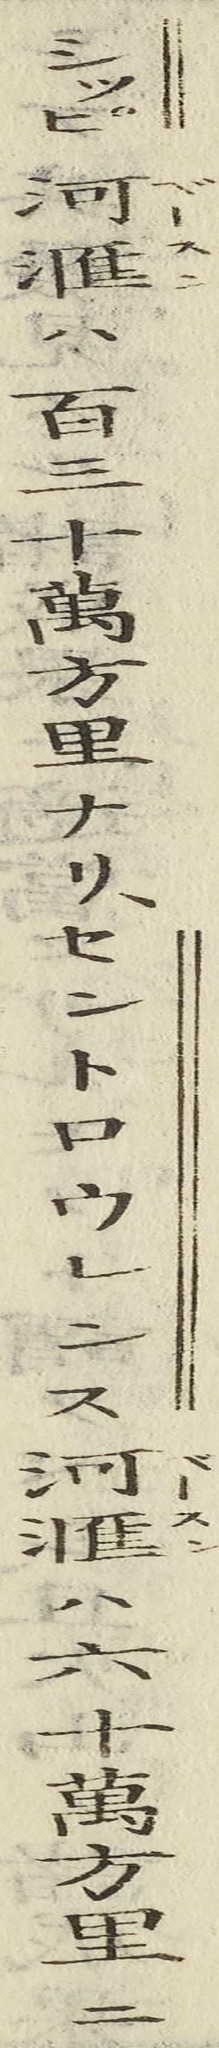シッピ河匯ハ百三十万方里ナリ、セントロウレンス河匯ハ六十万方里ニ
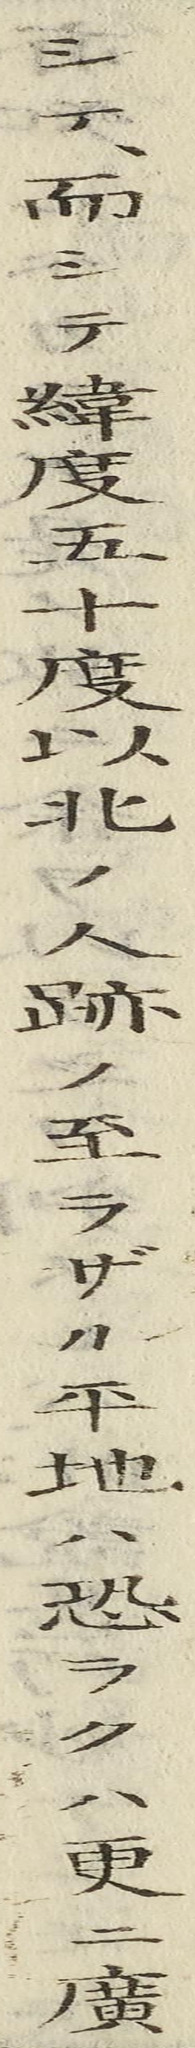シテ、而シテ緯度五十度以北ノ人跡ノ至ラザル平地ハ恐ラクハ更ニ広
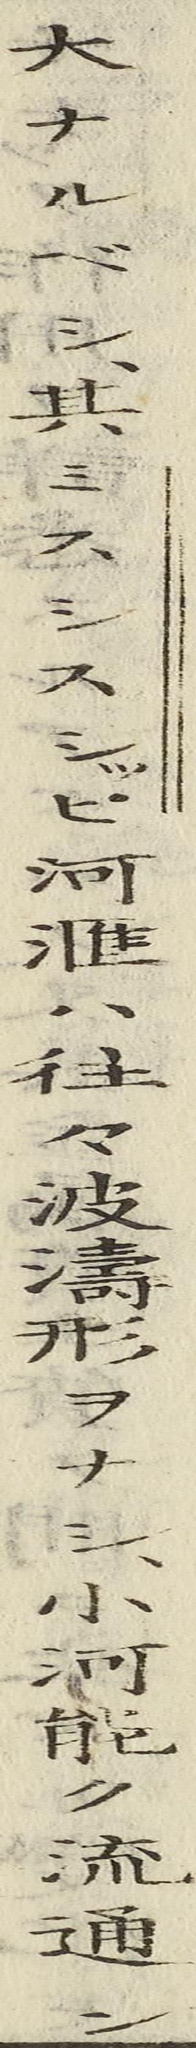大ナルベシ、其ミスシスシッピ河匯ハ往々波濤形ヲナシ、小河能ク流通シ
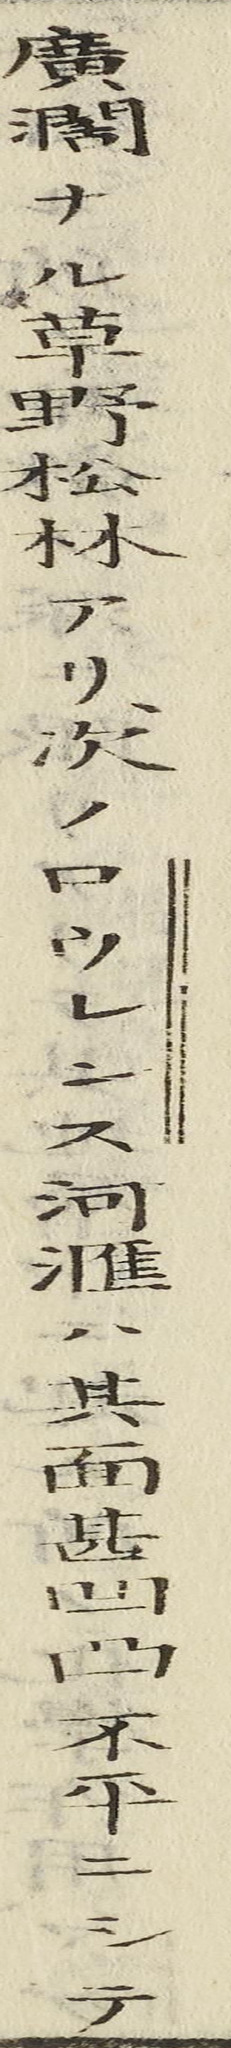広濶ナル草野松林アリ、次ノロウレンス河匯ハ其面甚凹凸不平ニシテ
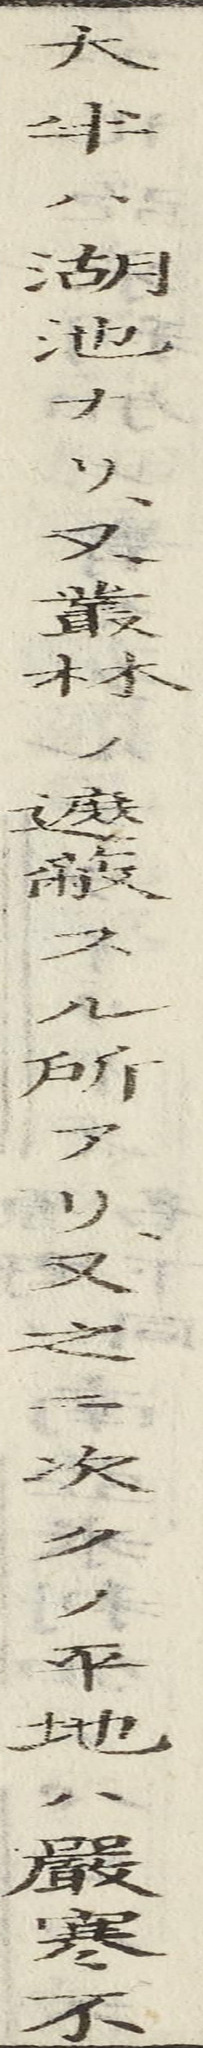大半ハ湖池ナリ、又叢林ノ遮蔽スル所アリ、又之ニ次クノ平地ハ厳寒不
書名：百科全書　地文學　全
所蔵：東京大学地震研究所図書室 Earthquake Research Institute Library, The University of Tokyo, JAPAN
